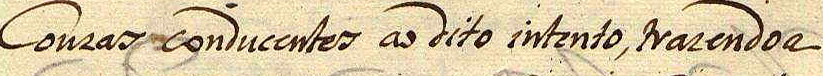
Couzas conducentes ao dito intento, trazendoa
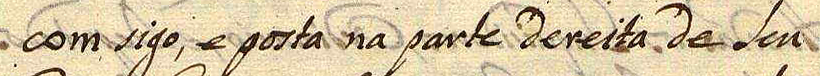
comsigo, e posta na parte dereita de Seu
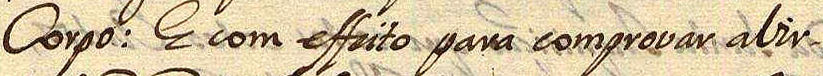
Corpo: E com effeito para comprovar a Vir
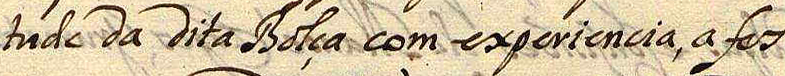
tude da dita Bolça com experiencia, a fes
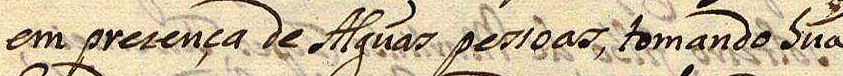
em prezença de Algūas pessoas, tomando hūa
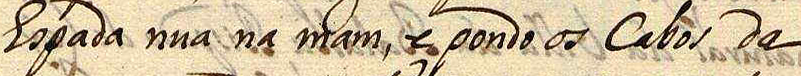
Espada nua na mam, e pondo os Cabos da
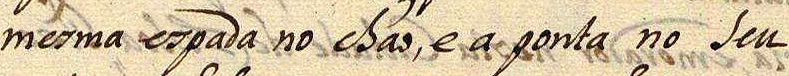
mesma espada no chão, e a ponta no Seu
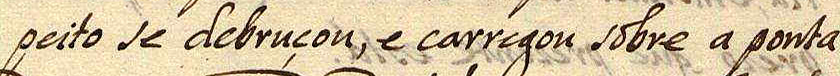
peito se debruçou, e carregou sobre a ponta
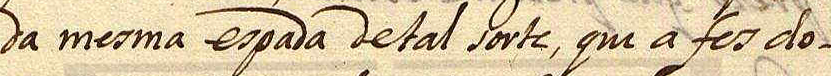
da mesma espada de tal sorte, que a fes do
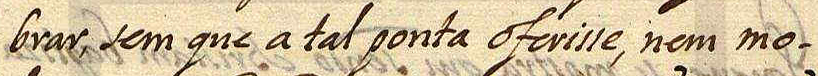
brar, sem que a tal ponta o ferisse, nem mo
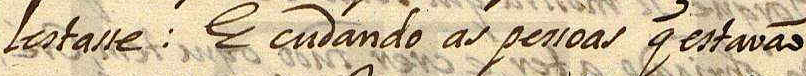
lestasse: E cudando as pessoas q̄ estavão
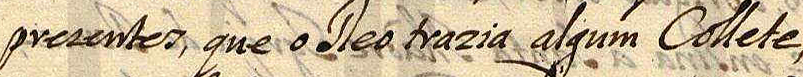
presentes, que o Reo trazia algum Collete,
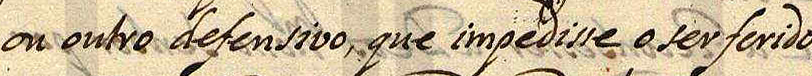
ou outro defensivo, que impedisse o ser ferido,
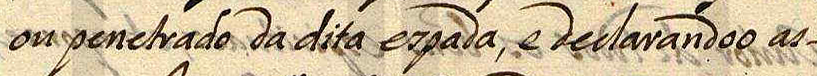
ou penetrado da dita espada, e declarandoo as
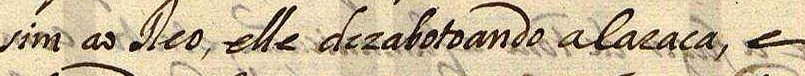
sim ao Reo, elle dezabotoando a Cazaca, e
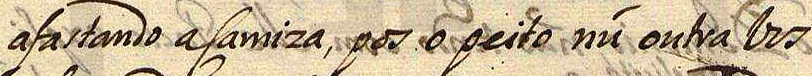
afastando a Camiza, pos o peito nú outra Ves
